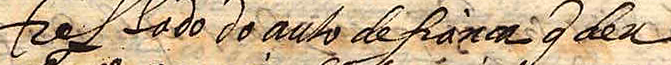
treslado do auto de fiança q̄ deu
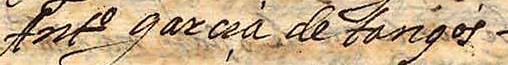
Anto garçea de tanqos
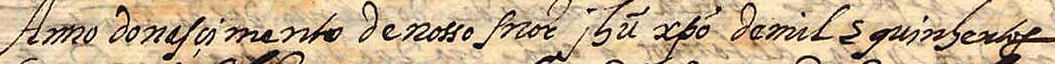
Anno do nasçimento de nosso snor̄ jhū xpō de mil E quinhentos
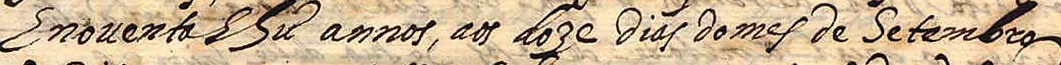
E nouenta E hū annos, aos doze dias do mes de Setembro
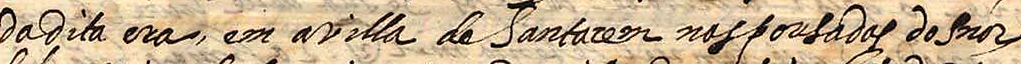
da dita era, em a villa de Santarem nas pousadas do Snor̄
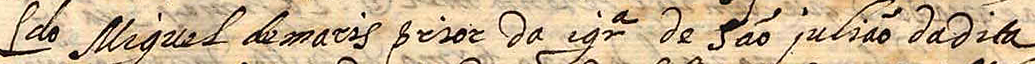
Ldo Miguel de maris prior da igra de Saõ juliaõ da dita
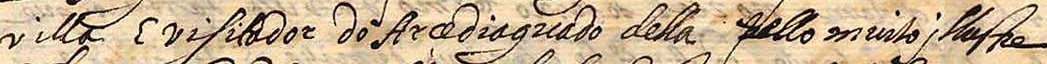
villa E visitador do Arçediaguado della pello muito jllustre
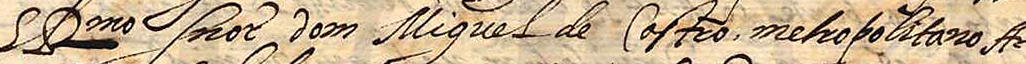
E Rmo Snor̄ dom Miguel de Castro metropolitano Ar
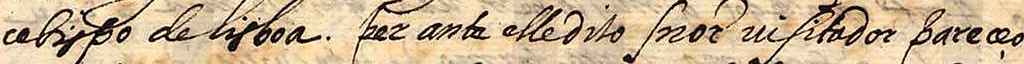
cebispo de lisboa. per ante elle dito snor̄ uisitador pareçeo
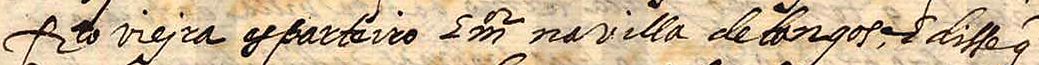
frco viejra esparteiro E mor na villa de tanqos; E disse q̄
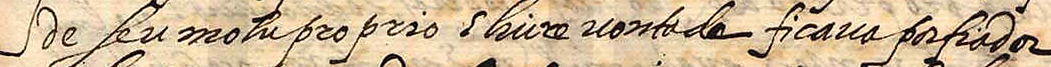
de seu motu proprio E liure uontade ficaua por fiador
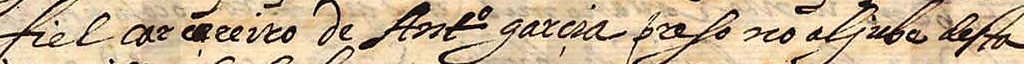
E fiel carçereiro de Anto garçia preso no aljube desta
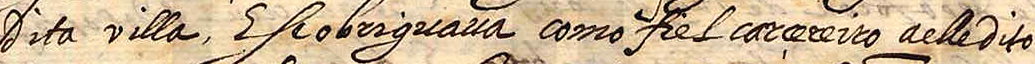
dita villa, E se obriguaua como fiel carçereiro a elle dito
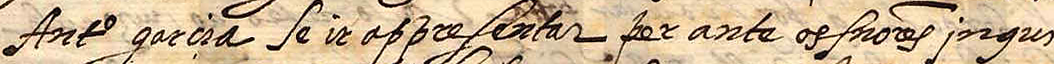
Anto garçia se ir appresentar perante os snor̄es jnqui
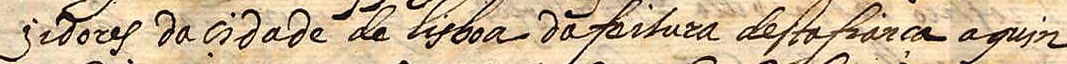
zidores da cidade de lisboa da feitura desta fiança a quin
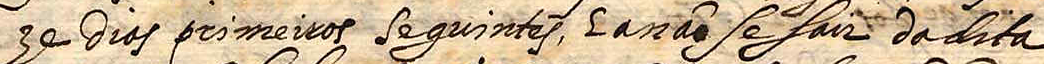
ze dias primeiros seguintes, E a não se sair da dita
